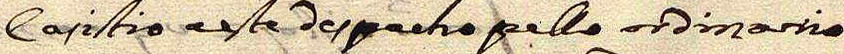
E asistio a este despacho pello ordinario
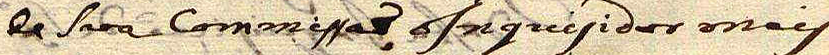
de sua commissaõ, o Jnquisidor mais
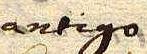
antigo.
